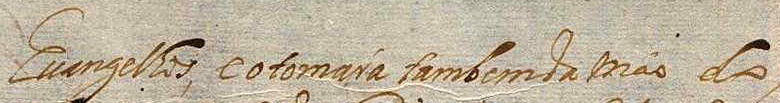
Euangelhos, e o tomará tambem da maõ do
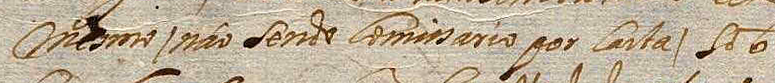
mesmo / não sendo Comissario por Carta / sob
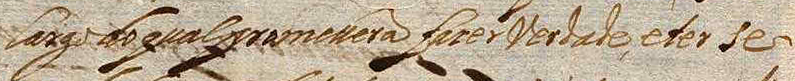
Cargo do qual promettera fazer verdade, e ter se
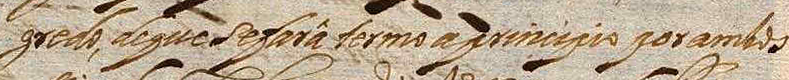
gredo, de que se fará termo a principio por ambos
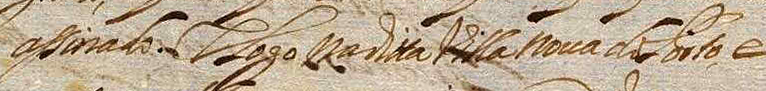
assinado. E Logo na ditta Villa noua do Porto, e
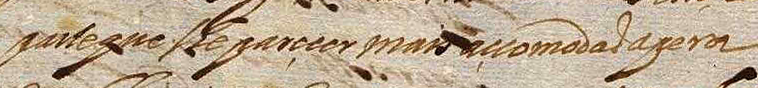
parte que lhe parecer mais accomodada pera
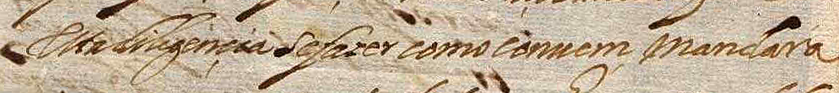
Esta diligençia se fazer como conuem mandara
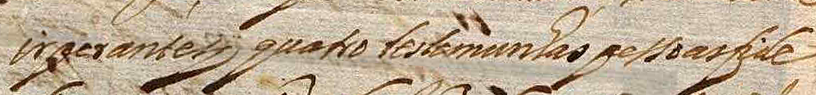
ir perante sy quatro testemunhas pessoas fide
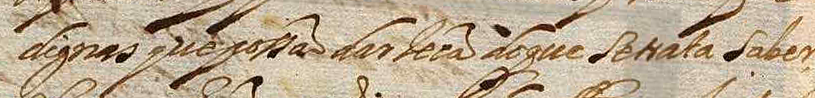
dignas que possaõ dar rezaõ do que se trata saber,
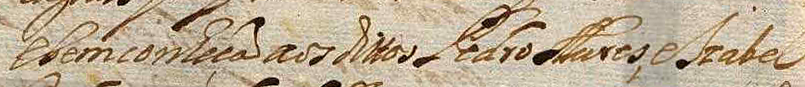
e bem conheçaõ aos dittos Pedro Alures, e Izabel
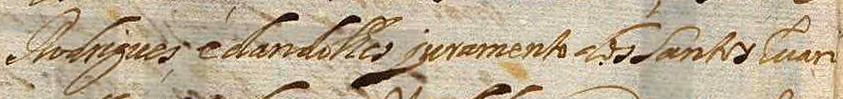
Rodrigues, e dandolhes juramento dos Santos Euan
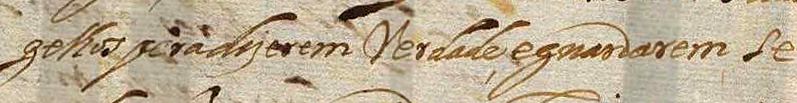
gelhos pera dizerem verdade, e guardarem se
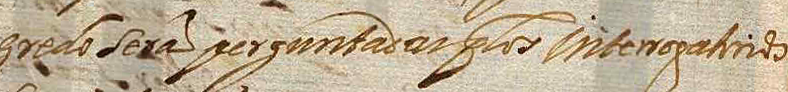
gredo seraõ perguntadas p̄los interrogatorios
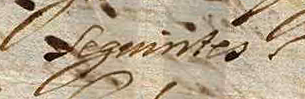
seguintes?
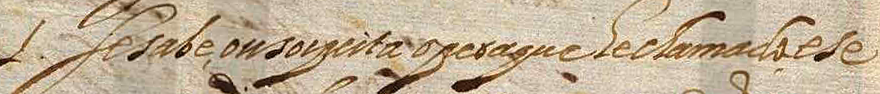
1. Se sabe, ou sospeita o pera que he chamado, e se
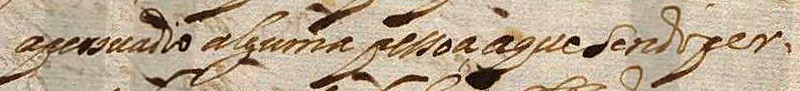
a persuadio alguma pessoa, a que sendo per
